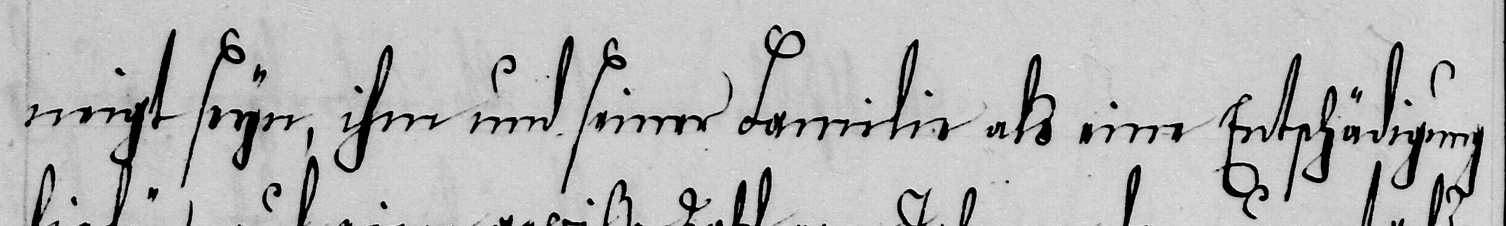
neigt seyn, ihm und seiner Familie als eine Entschädig¬
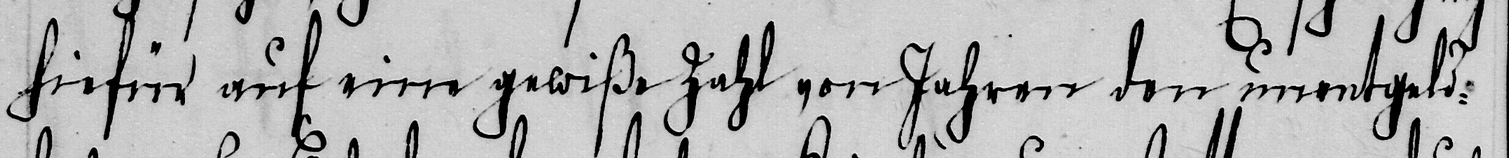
hiefür auf eine gewiße Zahl von Jahren den unentgeld¬
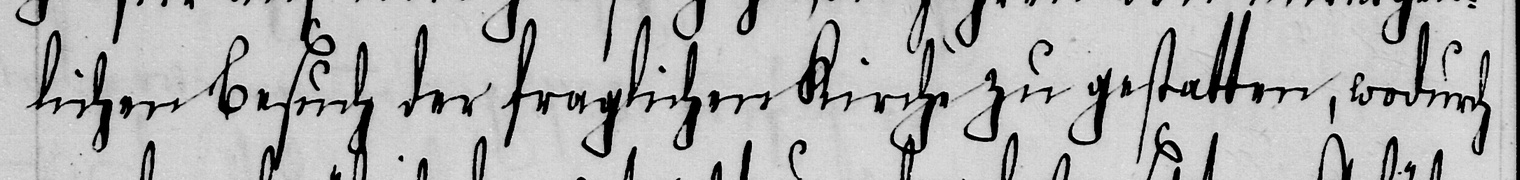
lichen Besuch der fraglichen Kirche zu gestatten, wodurch
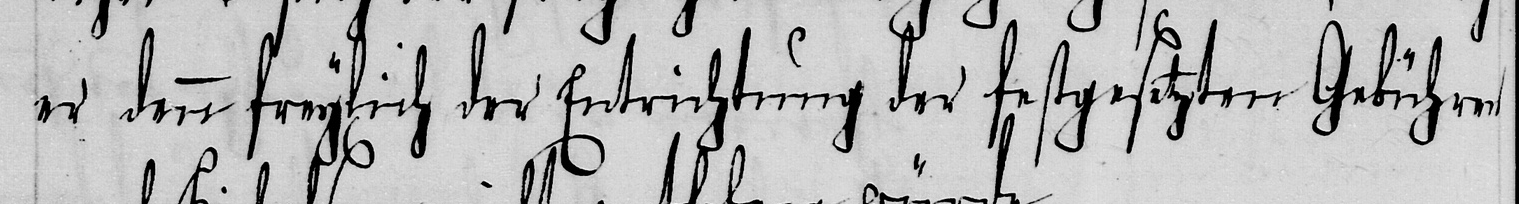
er denn freylich der Entrichtung der festgesetzten Gebühren
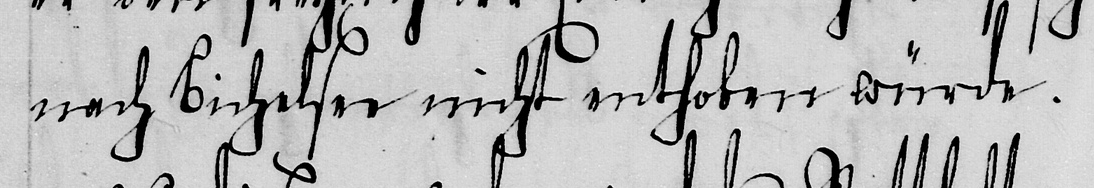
nach Bichelsee nicht enthoben würde.
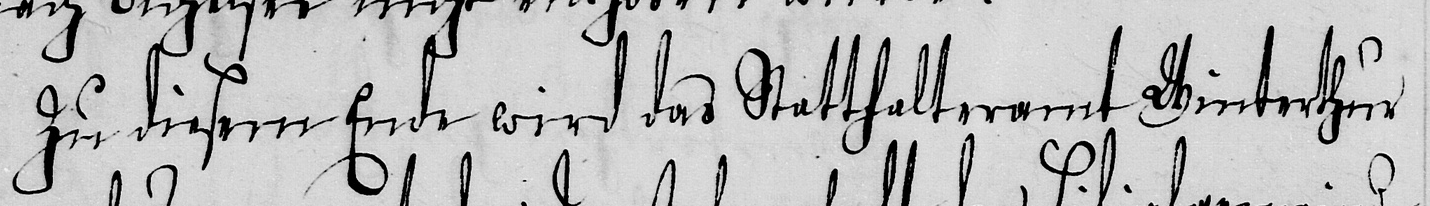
Zu diesem Ende wird das Statthalteramt Winterthur
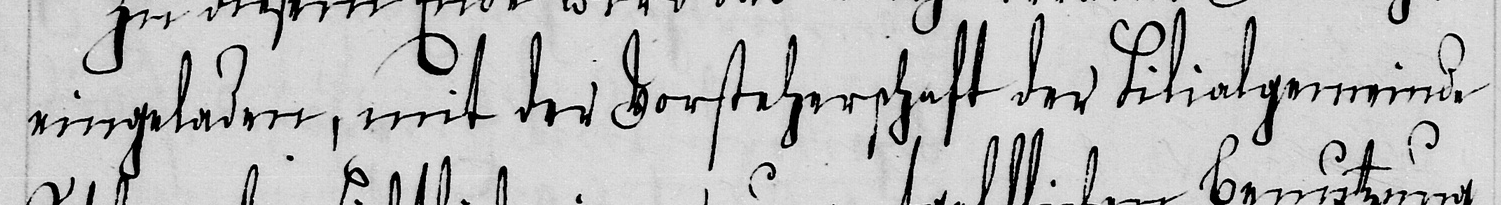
eingeladen, mit der Vorsteherschaft der Filialgemeinde
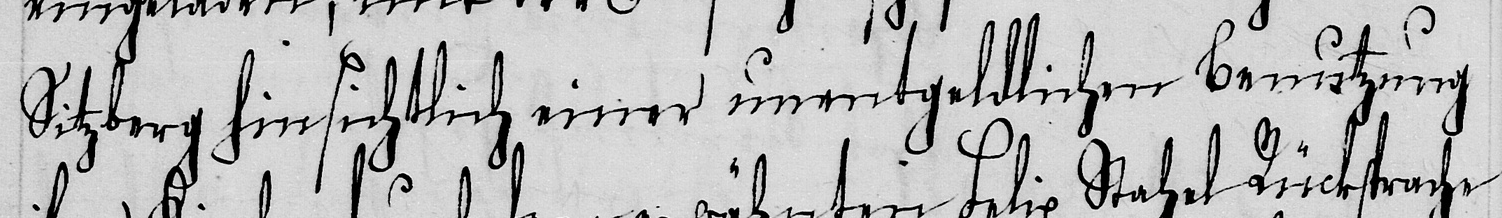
Sitzberg hinsichtlich einer unentgeldlichen Benutzung
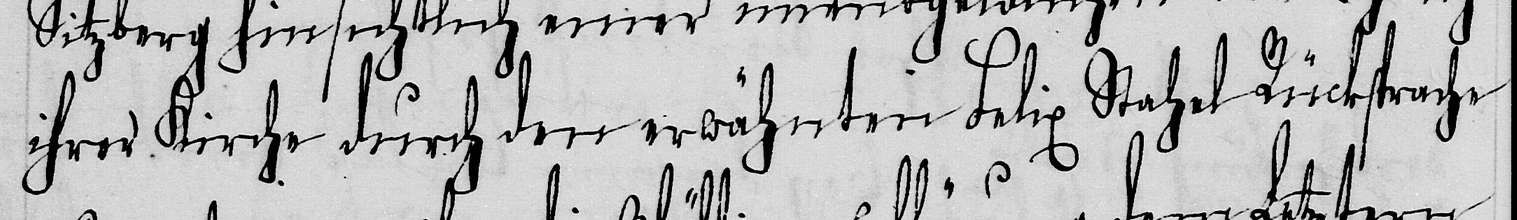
ihrer Kirche durch den erwähnten Felix Stahel Rücksprache
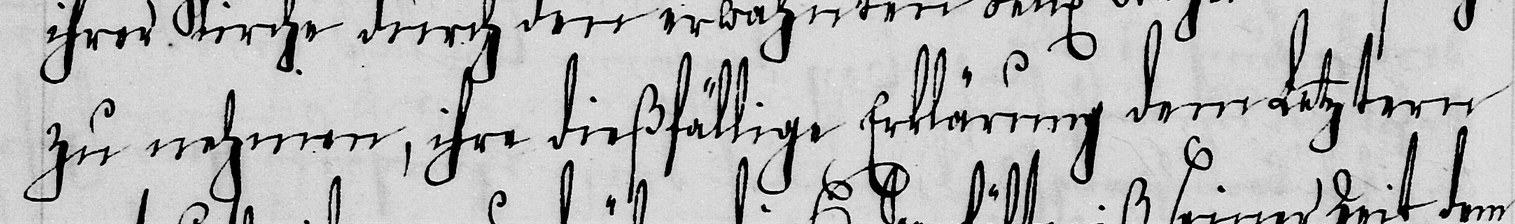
zu nehmen, ihre dießfällige Erklärung dem Letztern
